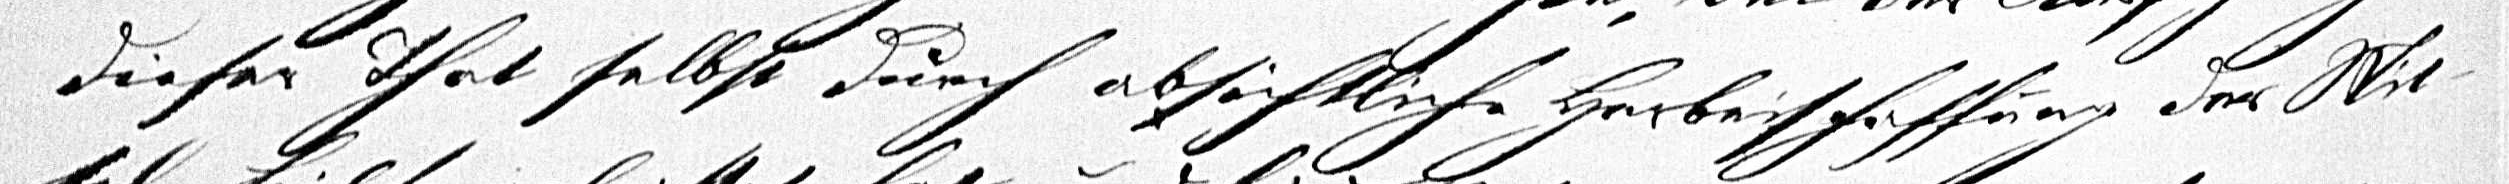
dieser That selbst durch absichtliche Herbeischaffung der Mit¬
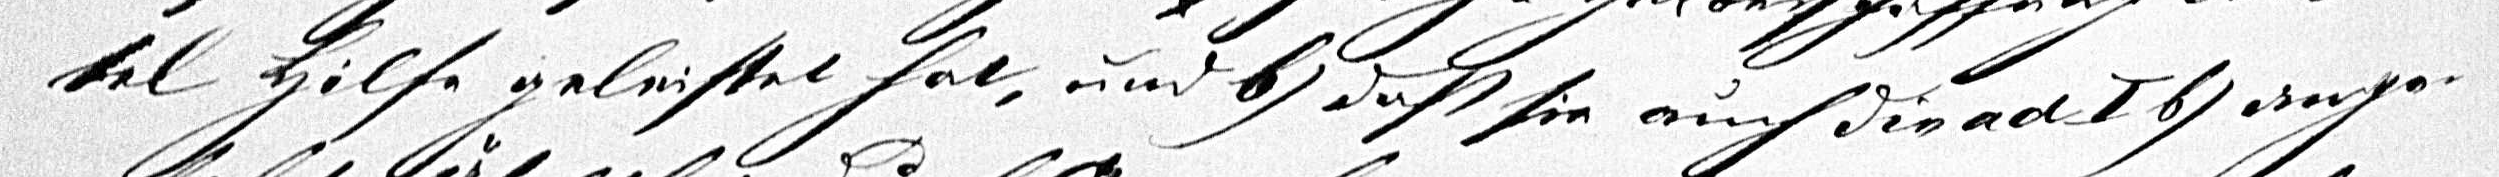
tel Hilfe geleistet hat, und b) daß sie auch die ad Ib) ange¬
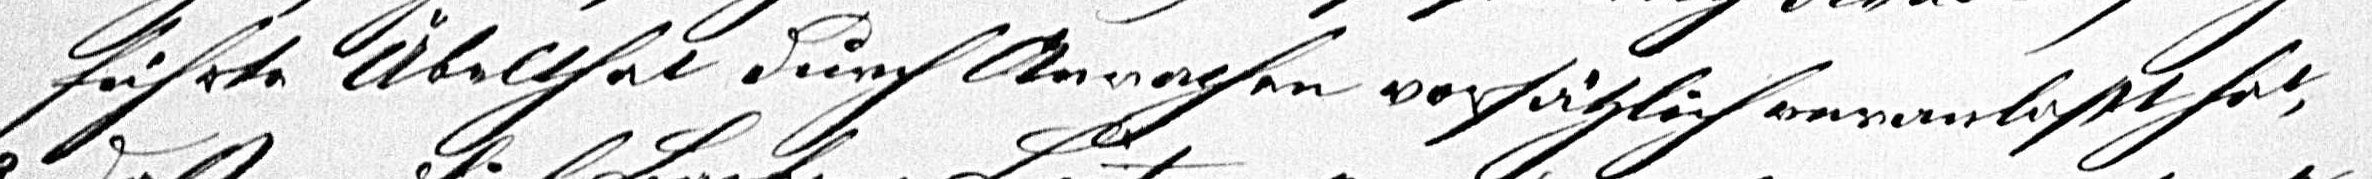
führte Übelthat durch Anrathen vorsätzlich veranlaßt hat,
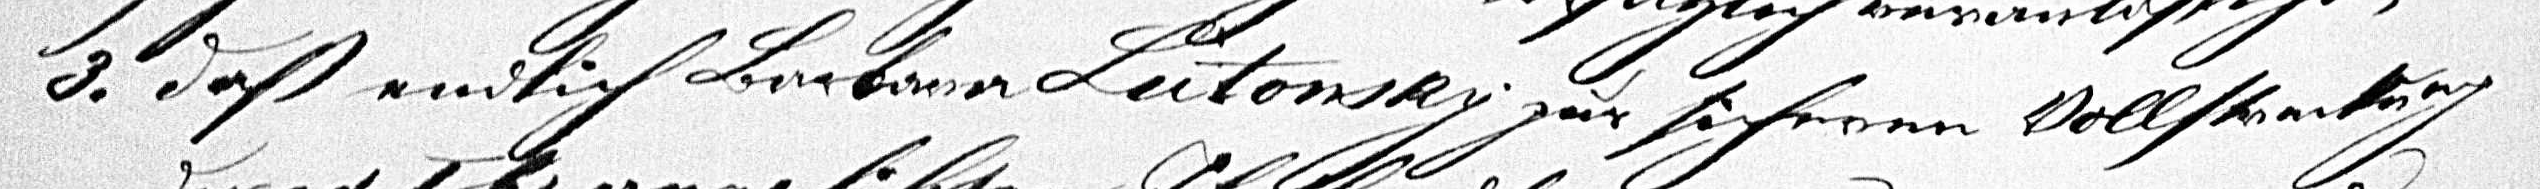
3. daß endlich Barbara Lutonsky zur sicheren Vollstreckung
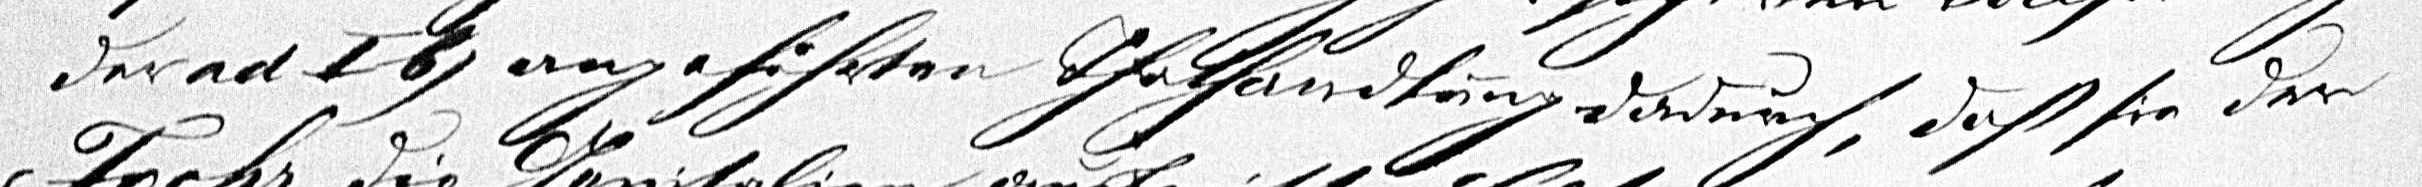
der ad Ib) angesicherten Thathandlung dadurch, daß sie der
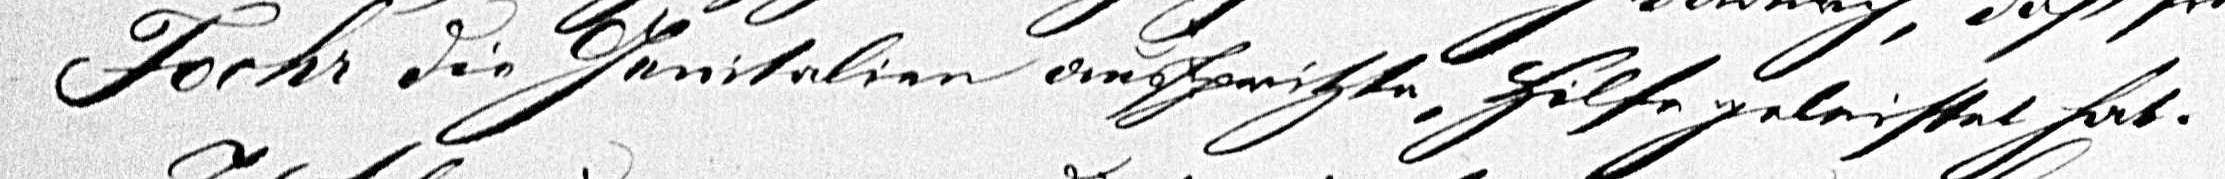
Foehr die Genitalien ausspritzte, Hilfe geleistet hat.
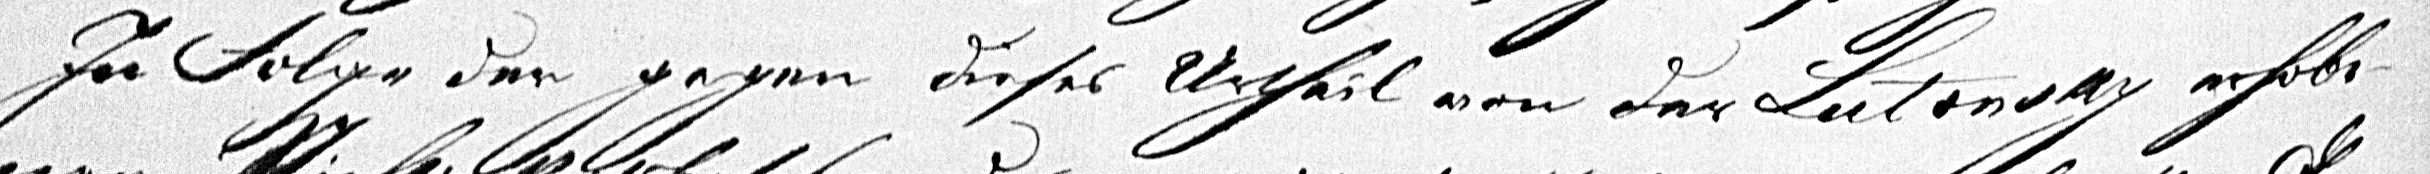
In Folge der gegen dieses Urtheil von der Lutonsky erhobe¬
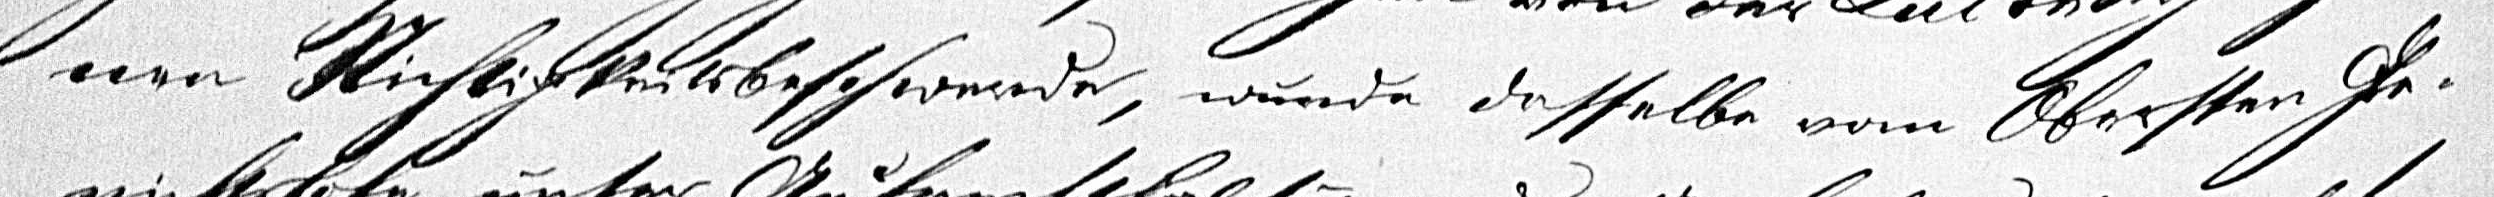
nen Richtigkeitsbeschwerden, wurde dasselbe vom Obersten Ge¬
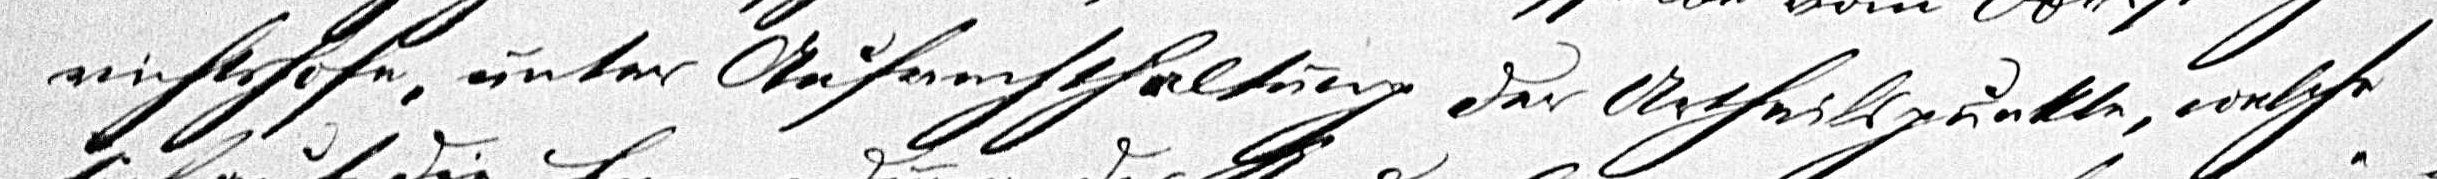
richtshofe, unter Ausverschaltung der Urtheilspunkte, welche
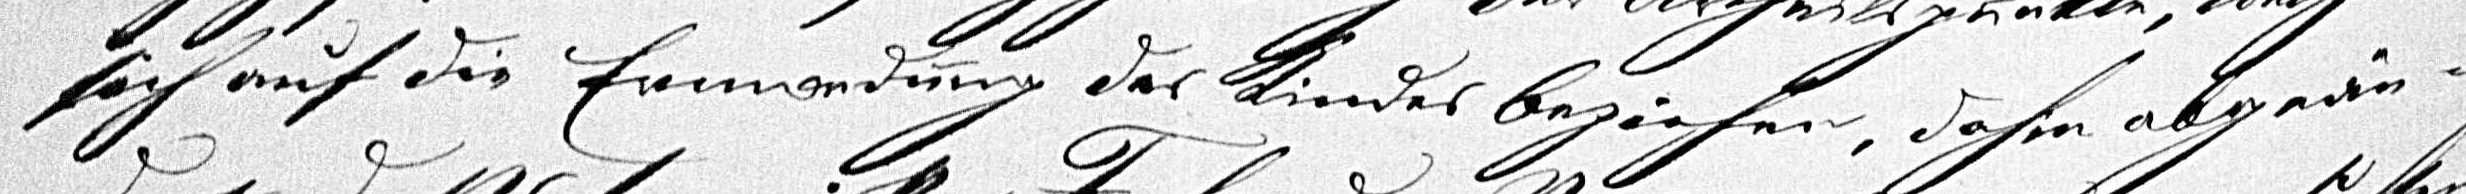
sich auf die Ermordung des Kindes beziehen, dahin abgeän¬
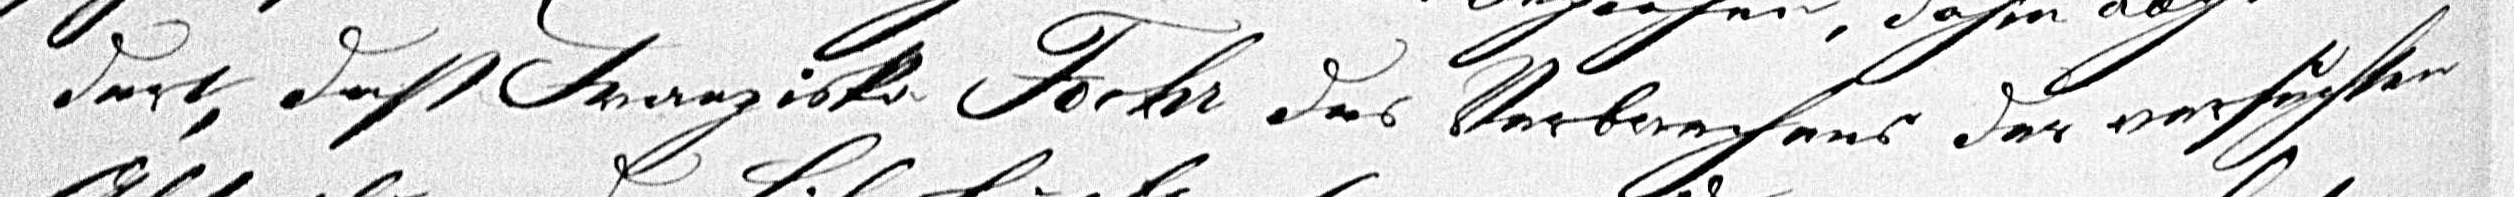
dert, daß Franziska Foehr des Verbrechens der versuchten
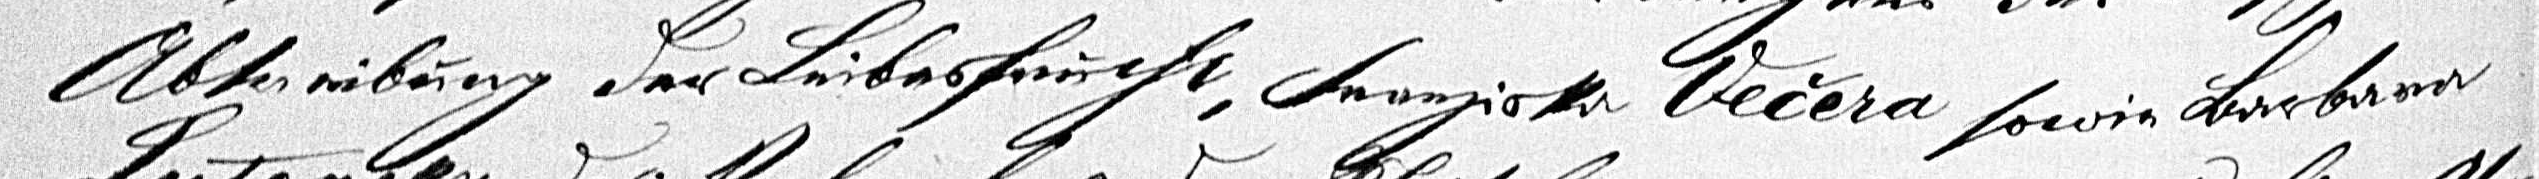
Abtreibung der Leibesfrucht, Franziska Večera sowie Barbara
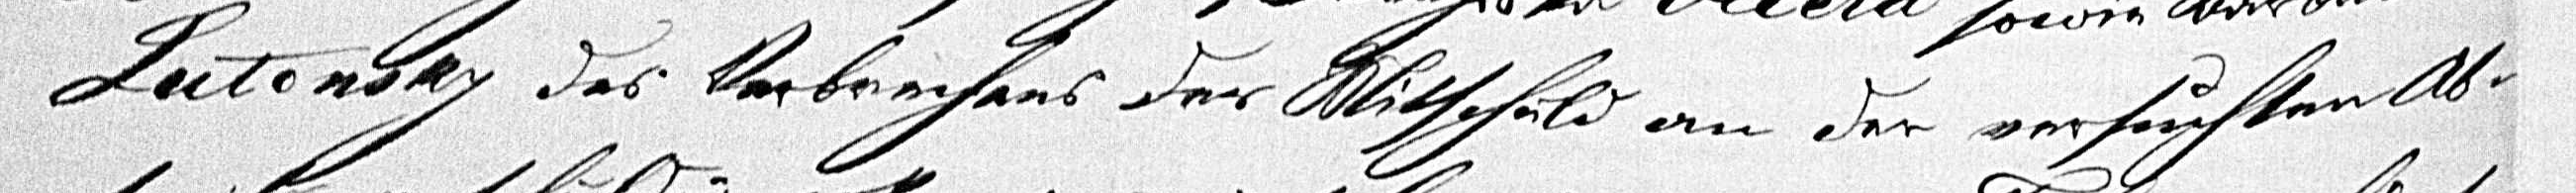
Lutonsky des Verbrechens der Mitschuld an der versuchten Ab¬
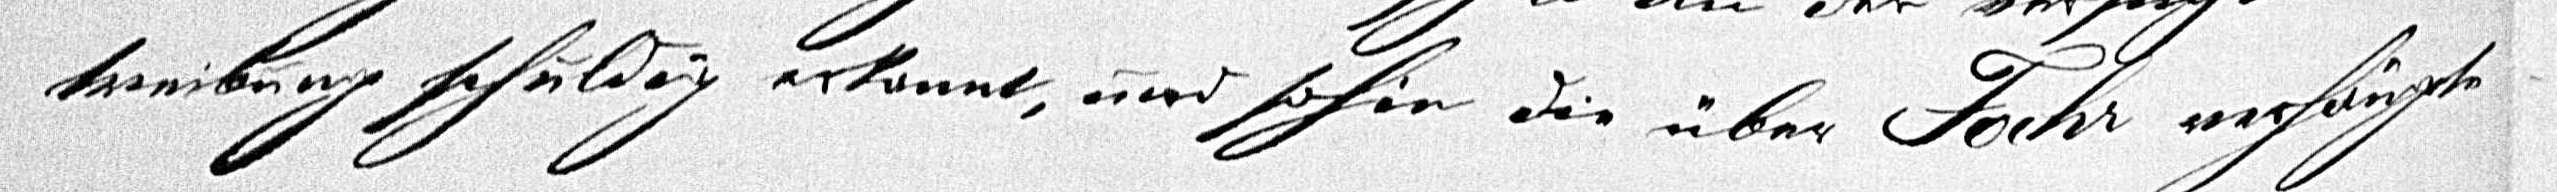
treibung schuldig erkannt, und sohin die über Foehr verhängte
